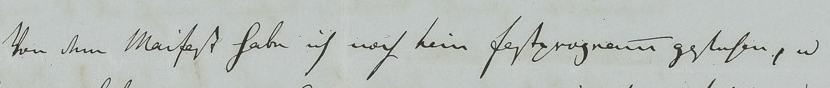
Von dem Maifest habe ich noch kein Festprogramm gesehen, u
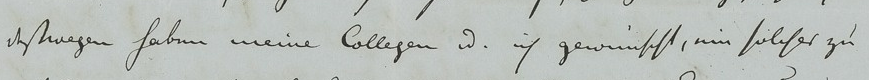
deßwegen haben meine Collegen u. ich gewünscht, ein solches zu
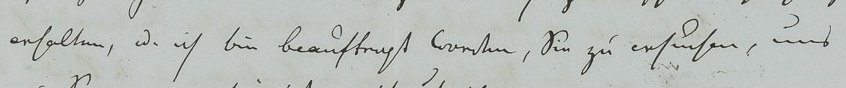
erhalten, u. ich bin beauftragt worden, Sie zu ersuchen, uns
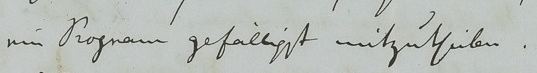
ein Program gefälligst mitzutheilen.
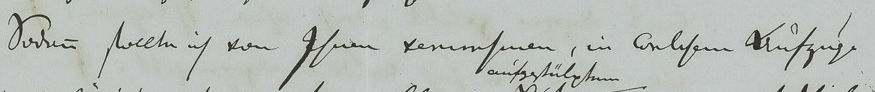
Sodann sollte ich von Ihnen vernehmen, in welchem Aufzuge
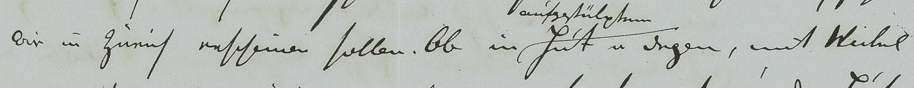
wir in Zürich erscheinen sollen. Ob in aufgestülptem Hut u Degen, mit Wickel
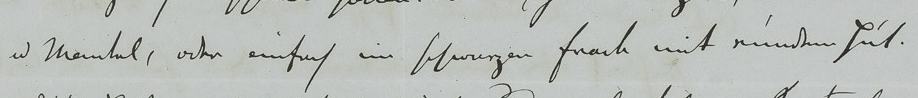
u Mantel, oder einfach im schwarzen Frack mit rundem Hut.
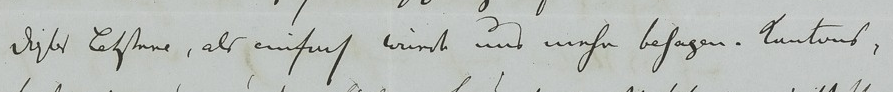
Dieses Letztere, als einfach würde uns mehr behagen. Kantons-
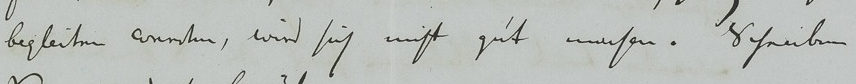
begleiten werden, wird sich nicht gut machen. Schreiben
